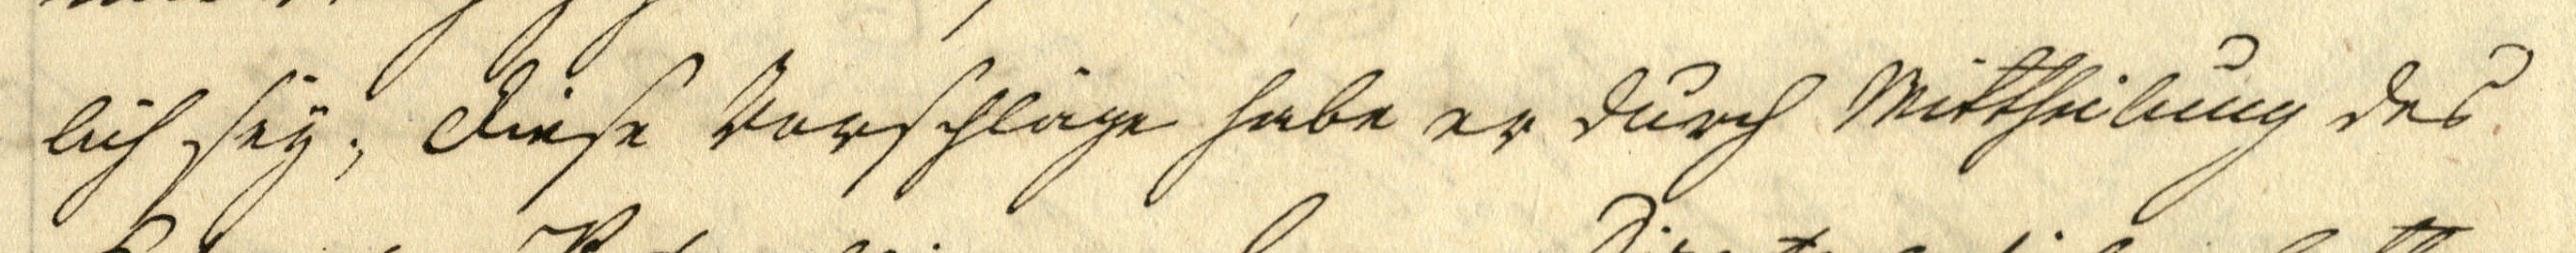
lich sey; Diese Vorschläge habe er durch Mittheilung des
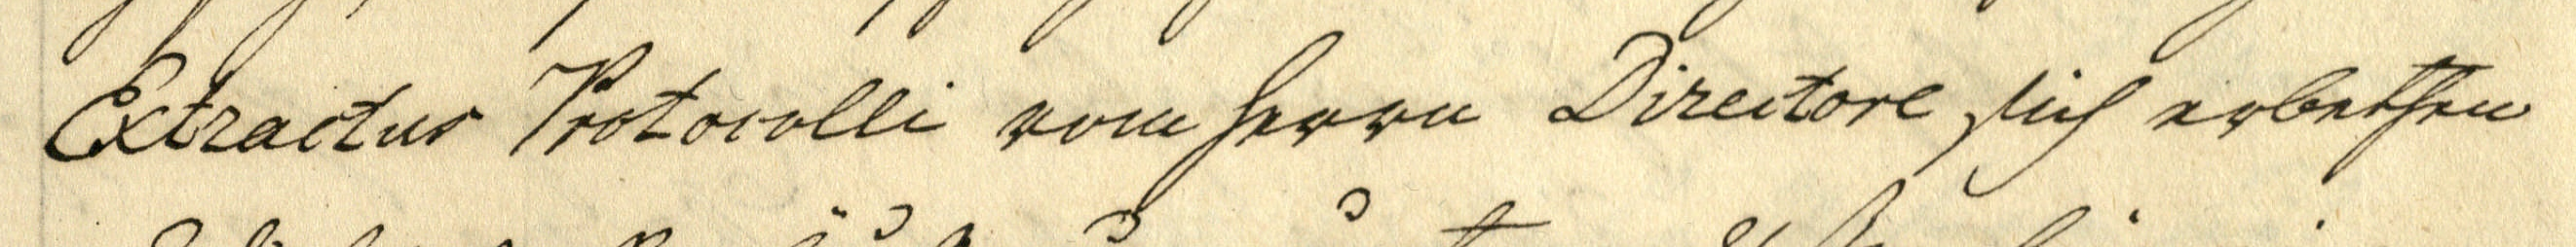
Extractus Protocolli vom Herrn Directore sich erbethen
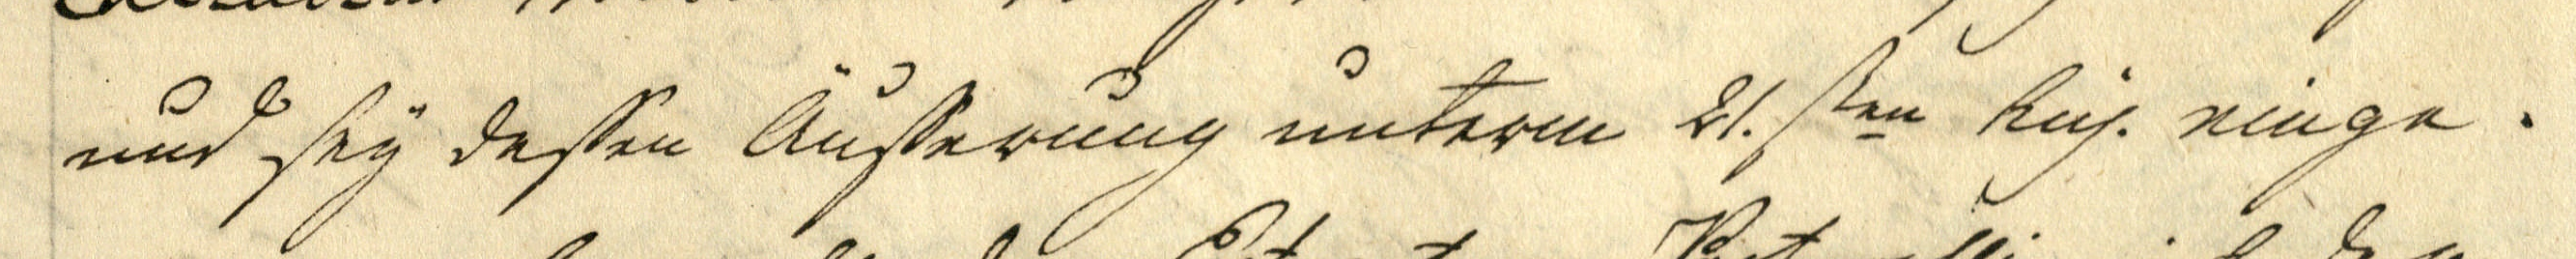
und sey dessen Äusserung unterm 21.sten huj. einge-
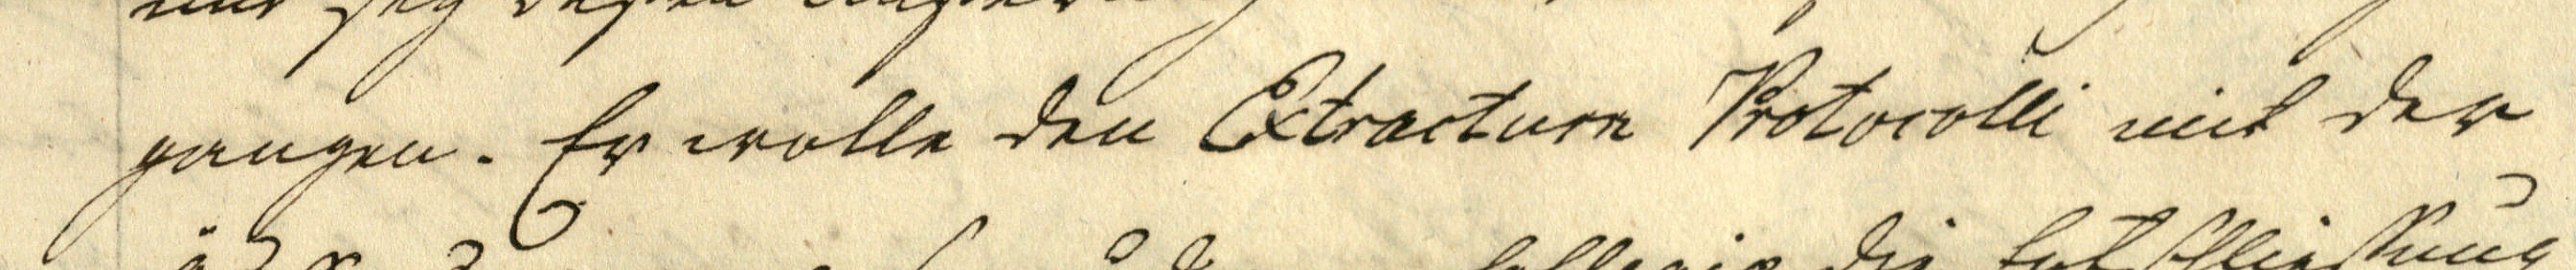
gangen. Er wolle den Extractum Protocolli mit der
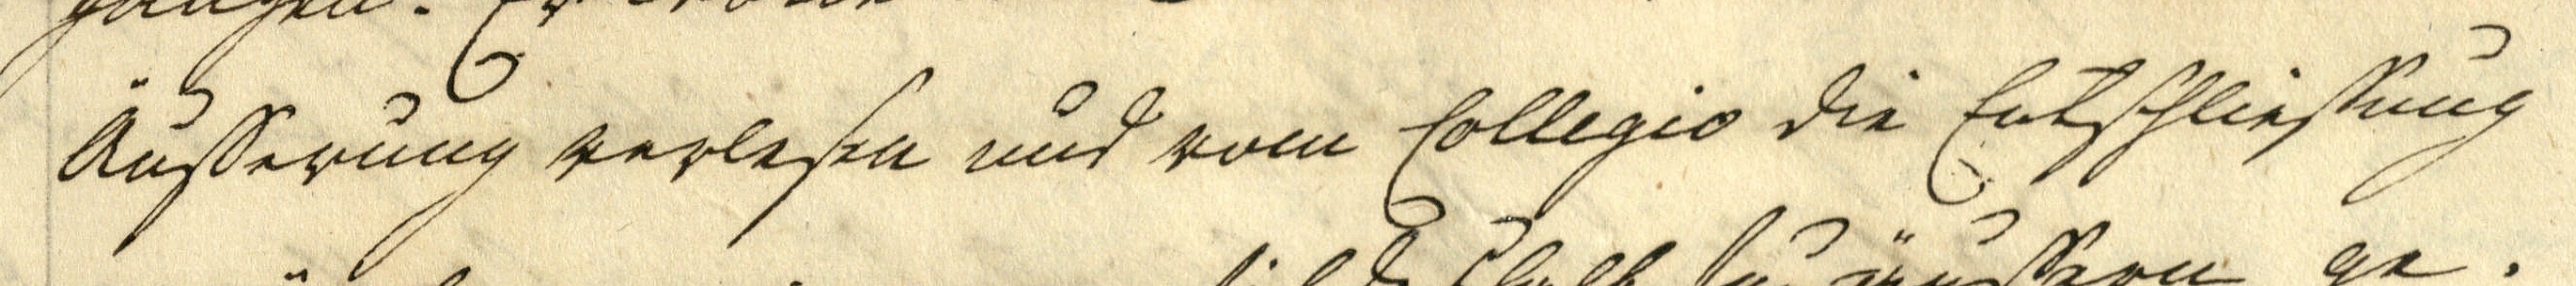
Äusserung verlesen und vom Collegio die Entschliessung
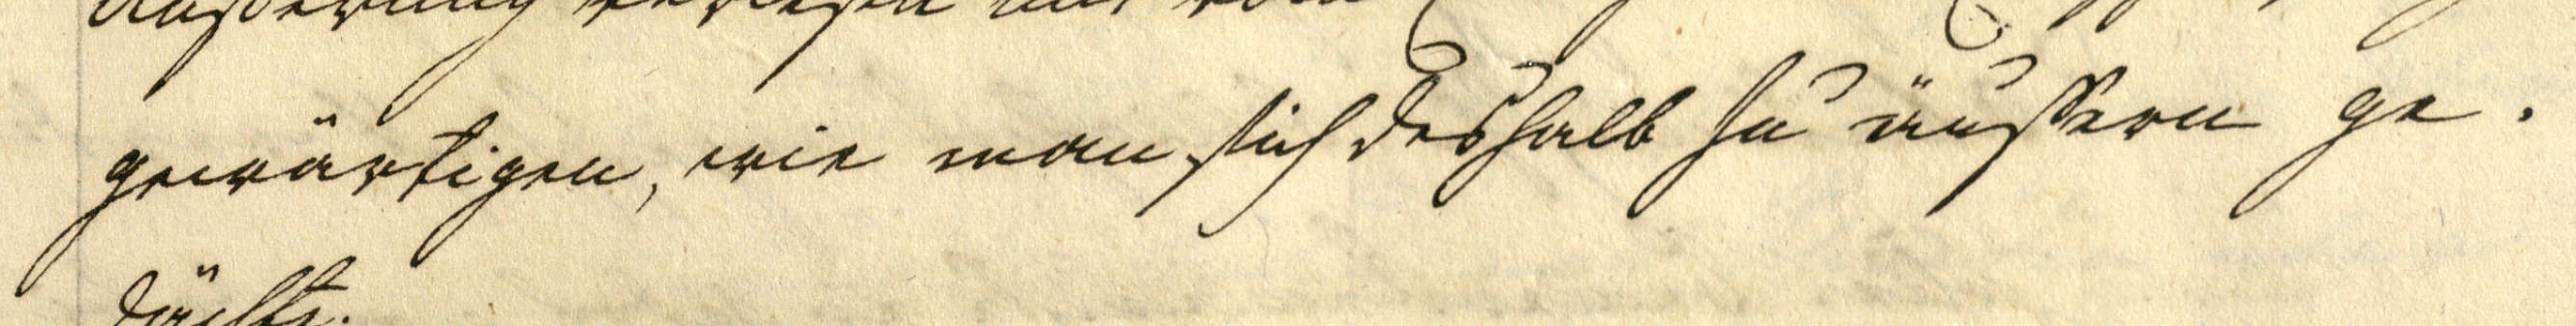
gewärtigen, wie man sich deshalb zu äussern ge-
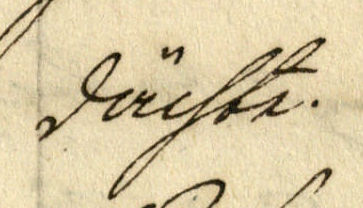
dächte.
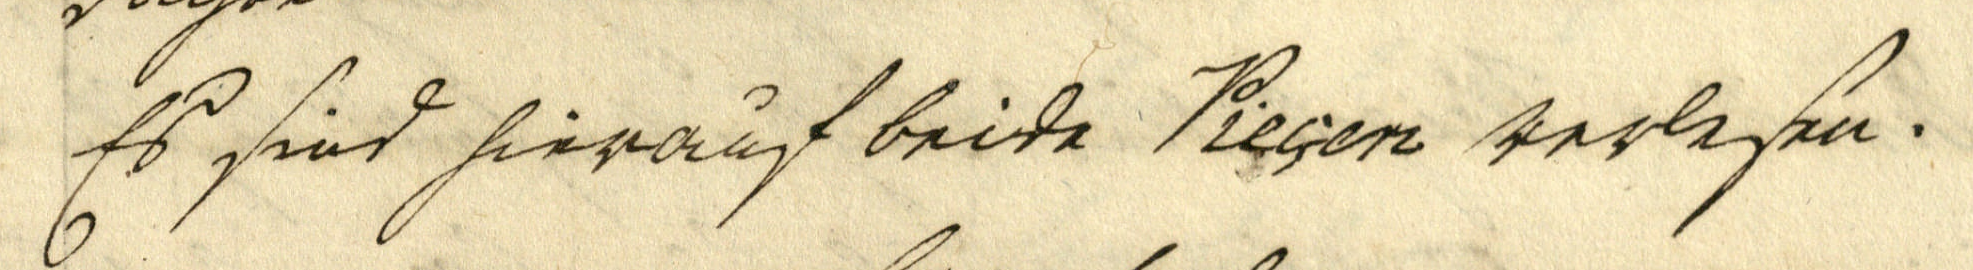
Es sind hierauf beide Piecen verlesen.
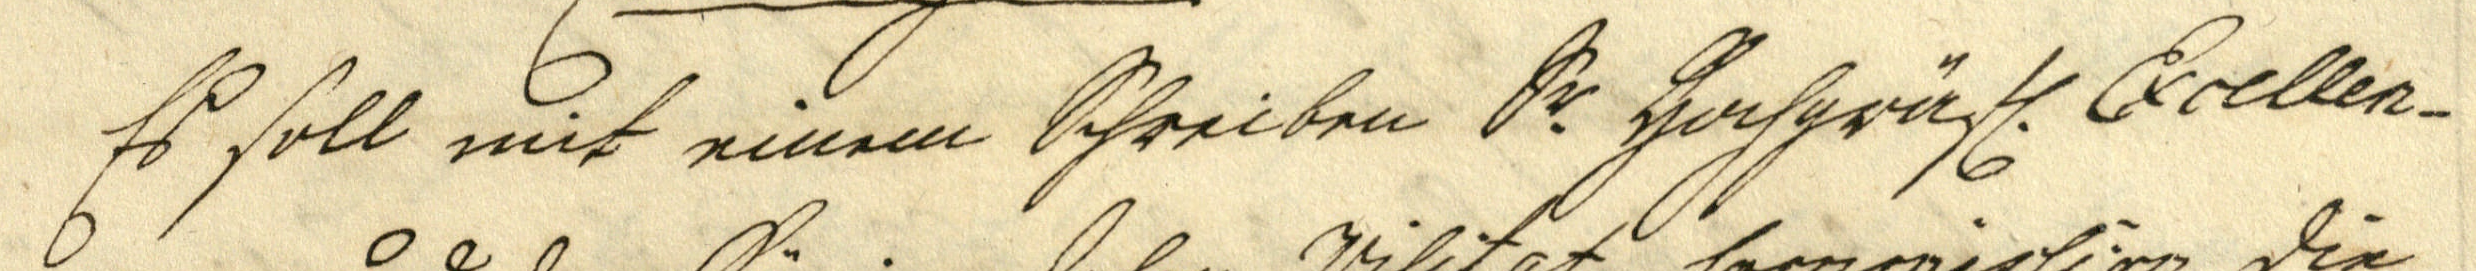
Es soll mit einem Schreiben Sr. Hochgräfl. Excellen-
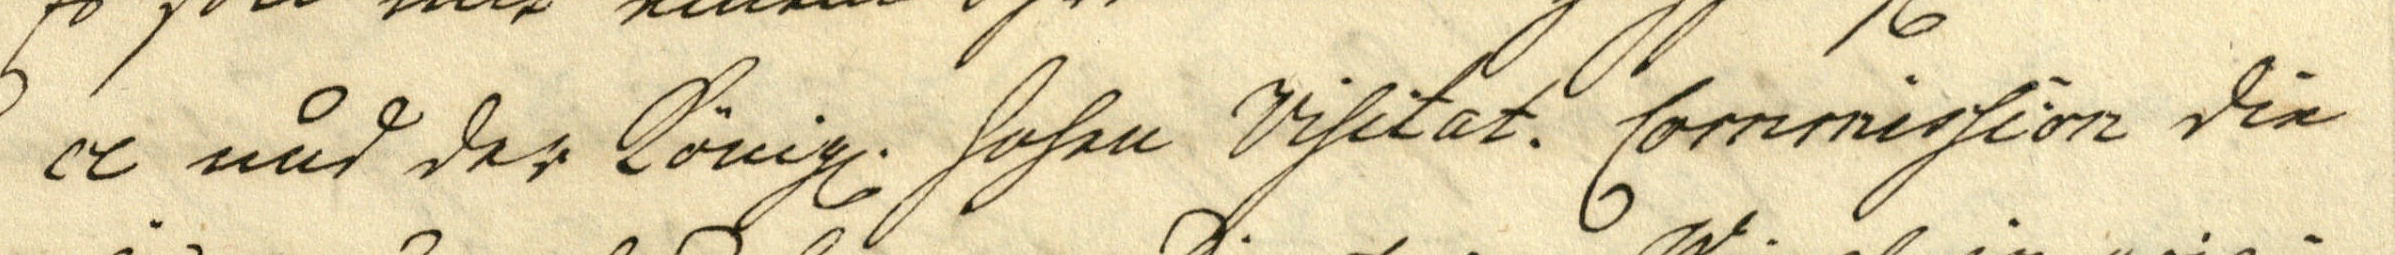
ce und der Königl. hohen Visitat. Commission die
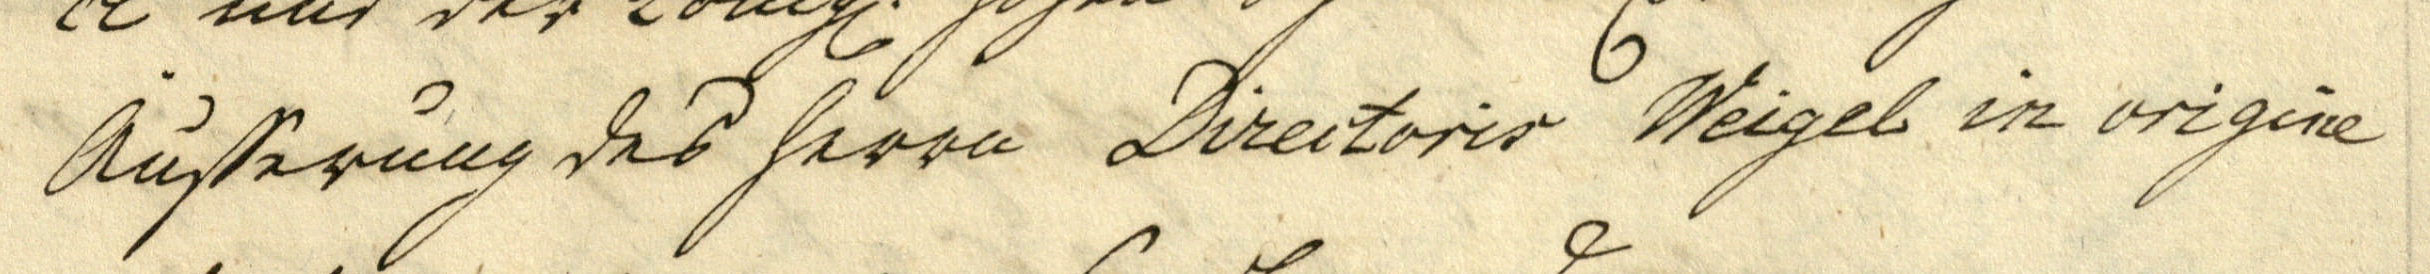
Äusserung des Herrn Directoris Weigel in origine
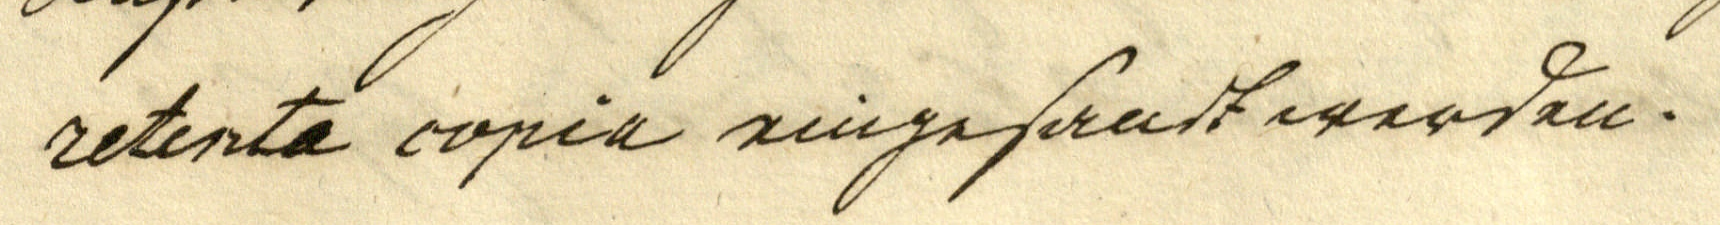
retente copia eingesandt werden.
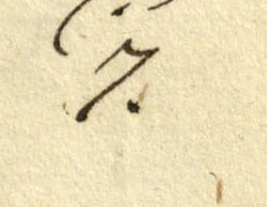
7.
